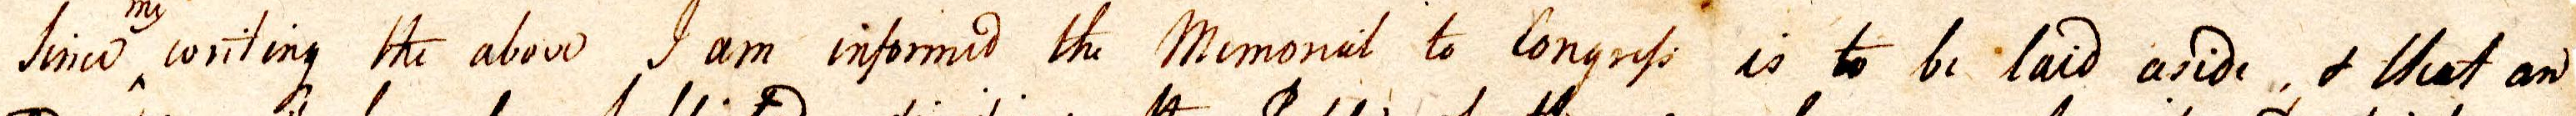Since ^my writing the above I am informed the Memorial to Congress is to be laid aside, & that an
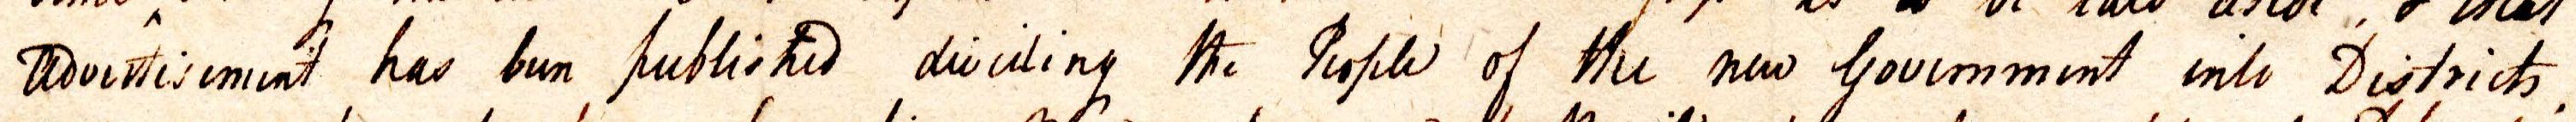advertisement has been published dividing the People of the new Government into Districts,
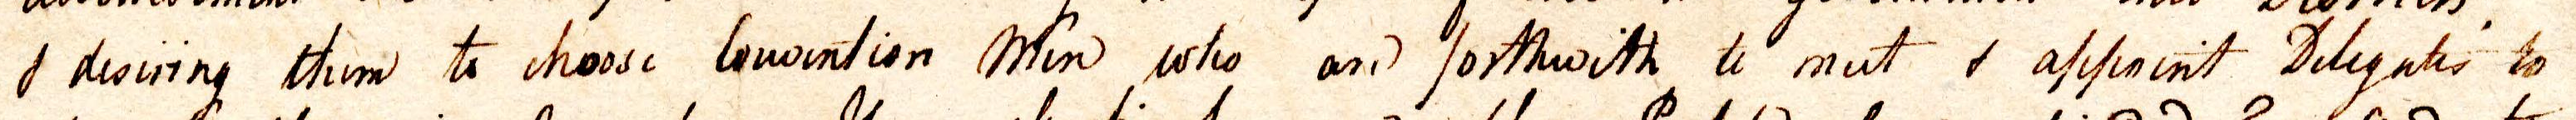& desiring them to choose Convention Men who are forthwith to meet & appoint Delegates to
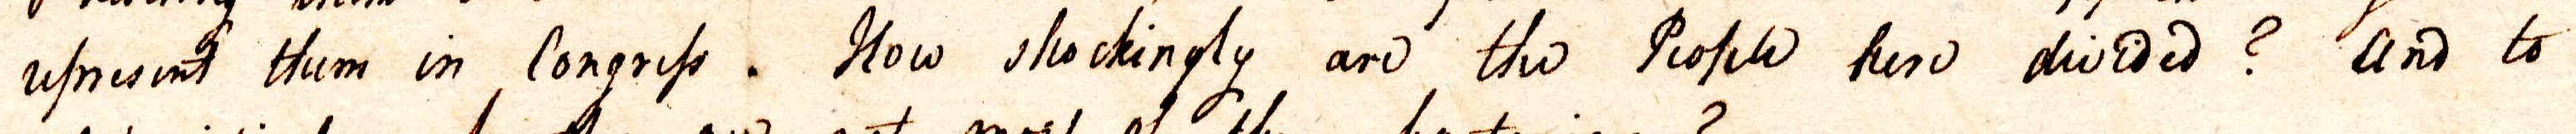represent them in Congress. How shockingly are the People here divided? And to
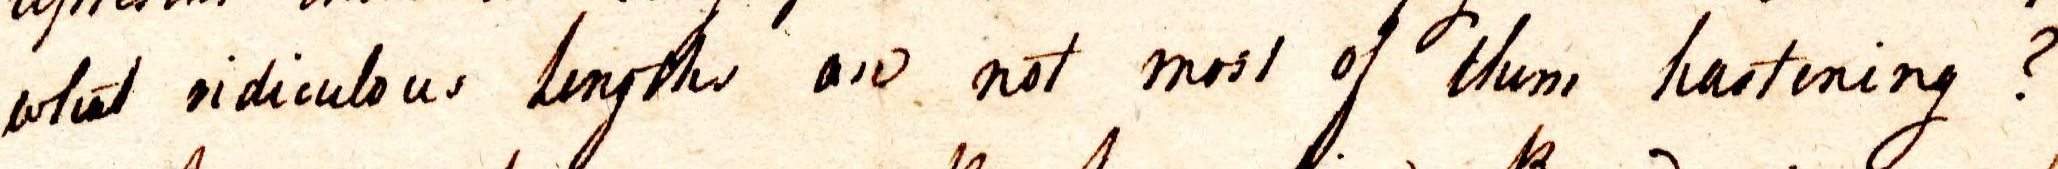what ridiculous Lengths are not most of them hastening?
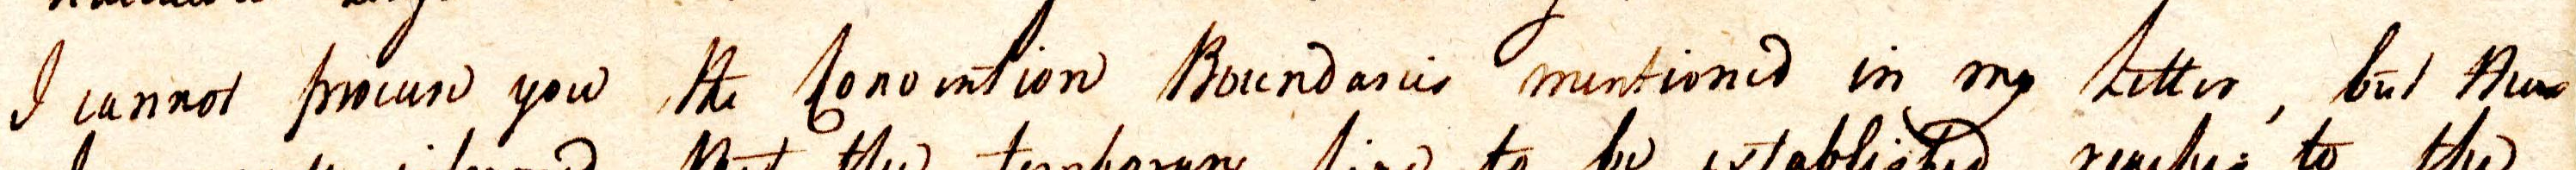I cannot procure you the Convention Boundaries mentioned in my Letter, but there
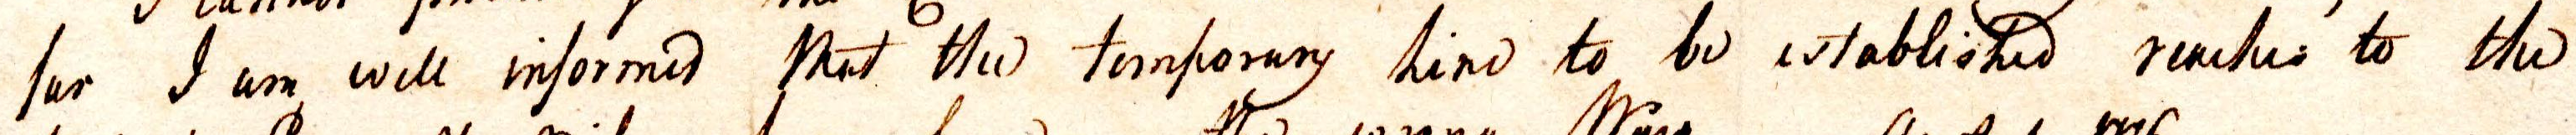for I am well informed that the temporary hire to be established reaches to the
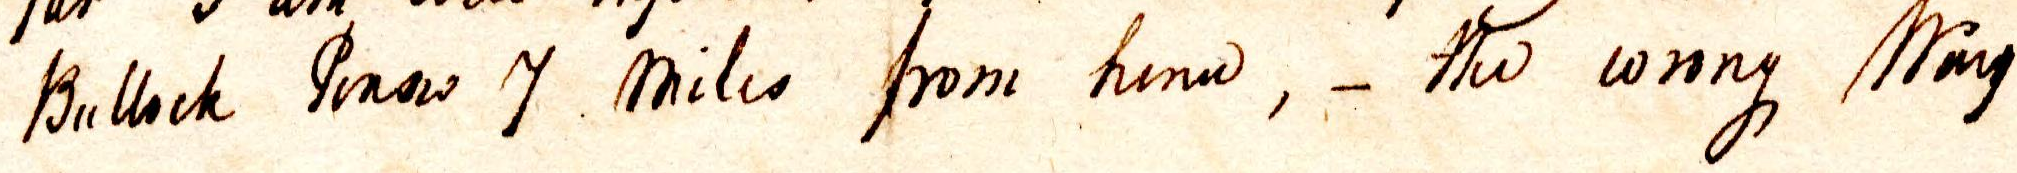Bullock Penses 7 Miles from hence,- the wrong Way.
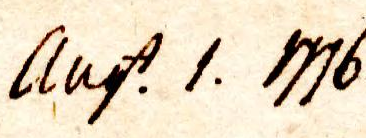Aug^t. 1. 1776.
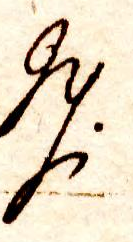JY.
